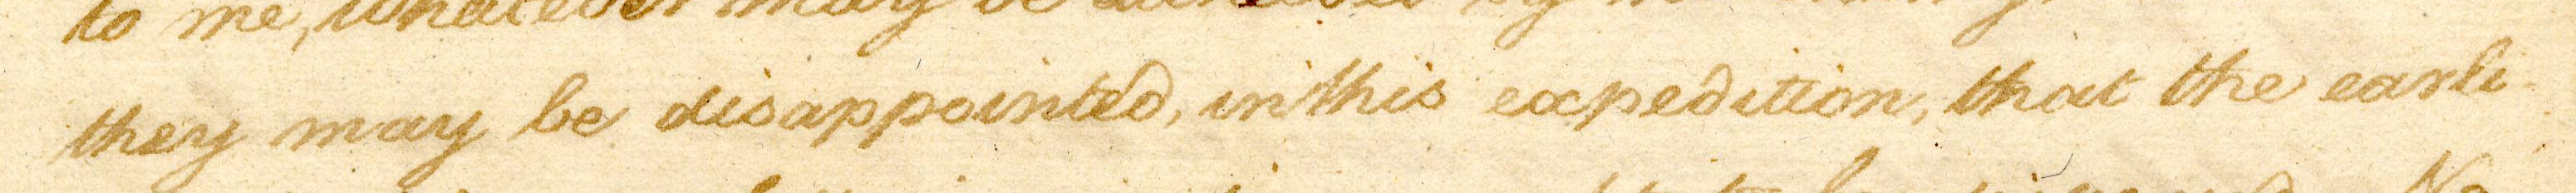they may be disappointed in this expedition, that the earli-
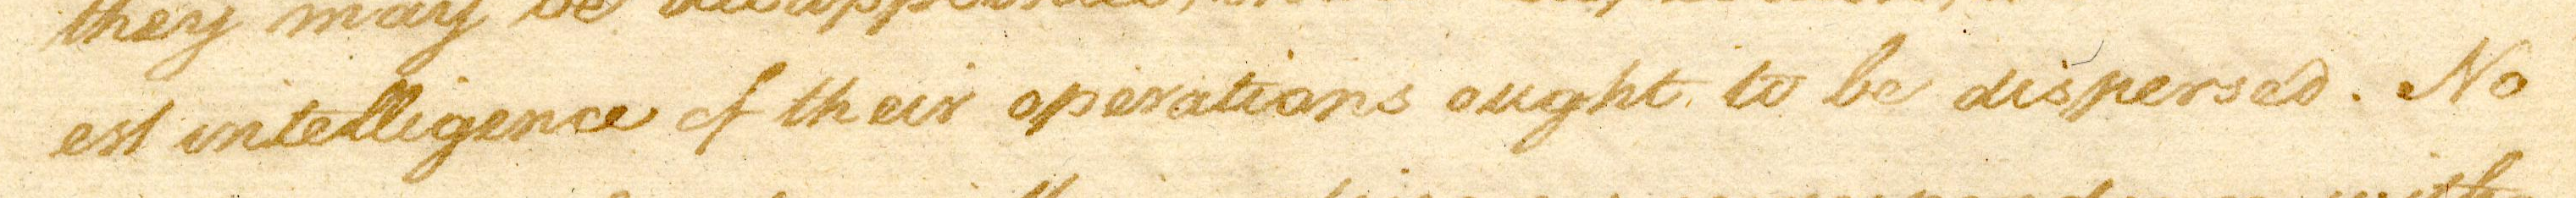est intelligence of their operations ought to be dispersed. No
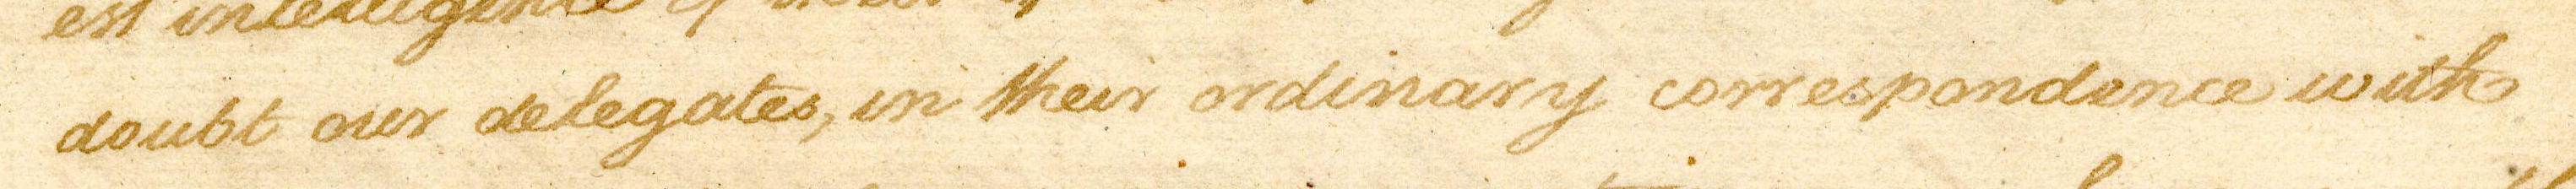doubt our delegates, in their ordinary correspondence with
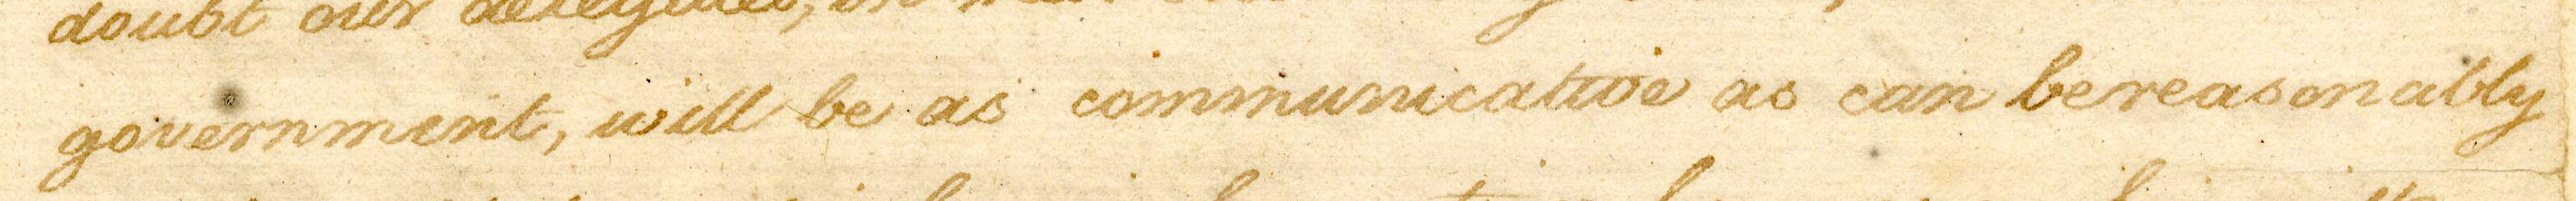government, will be as communicative as can be reasonably
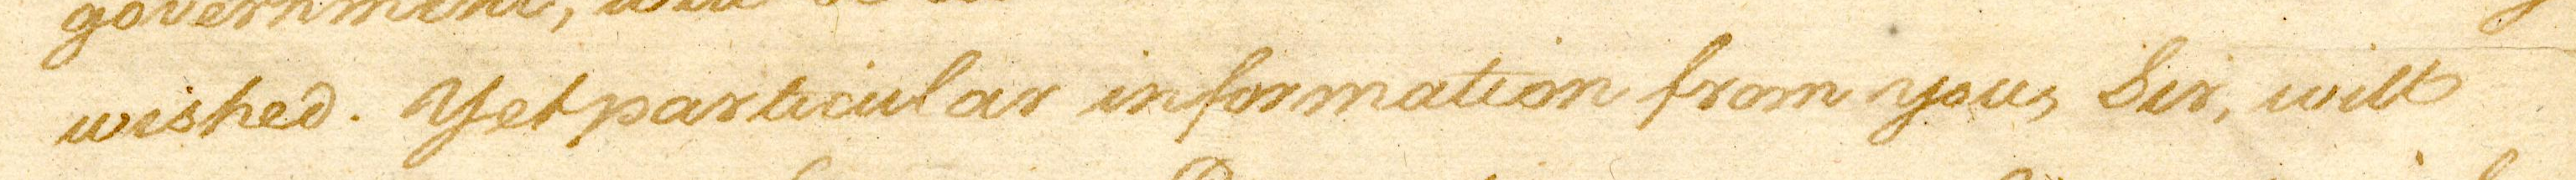wished. Yet particular information from you, Sir, will
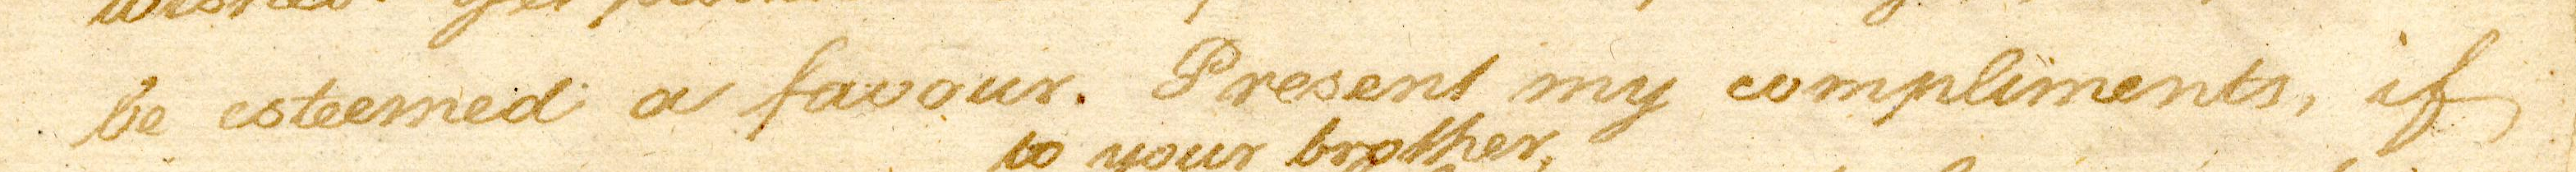be esteemed as favour. Present my compliments, if
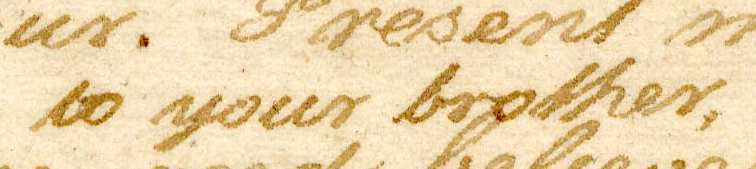to your brother,
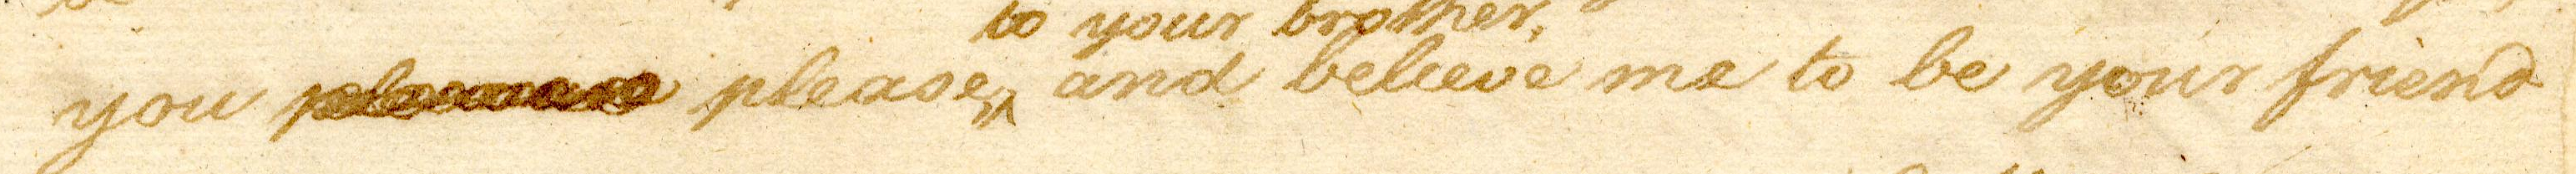you [______] please ^ and believe me to be your friend
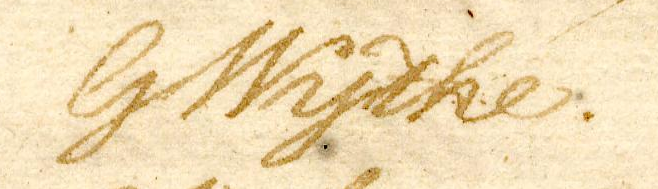G Wythe.
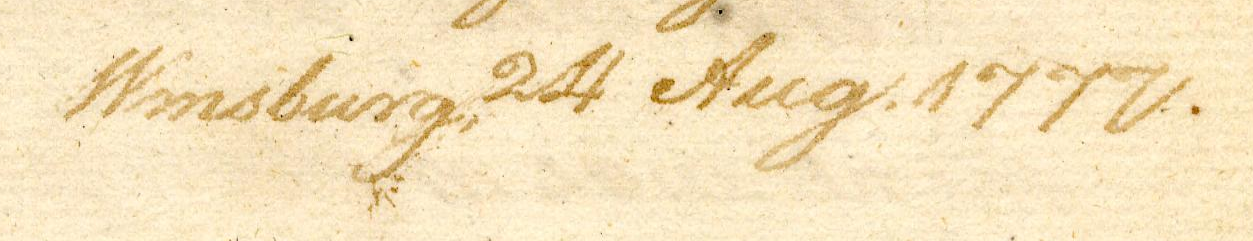Wmsburg 24 Aug. 1777.
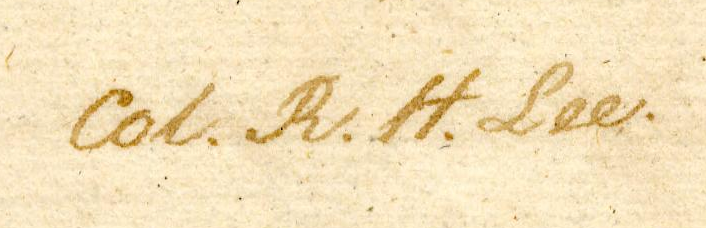Col. R. H. Lee
